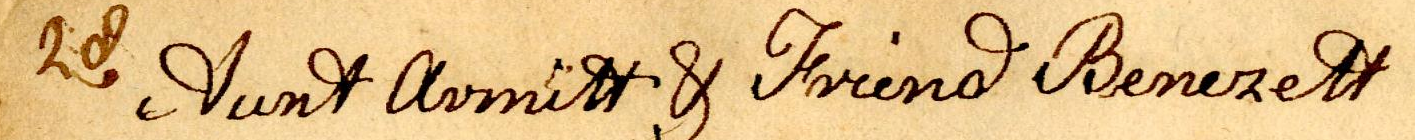^2d Aunt Armitt & Friend Benezett
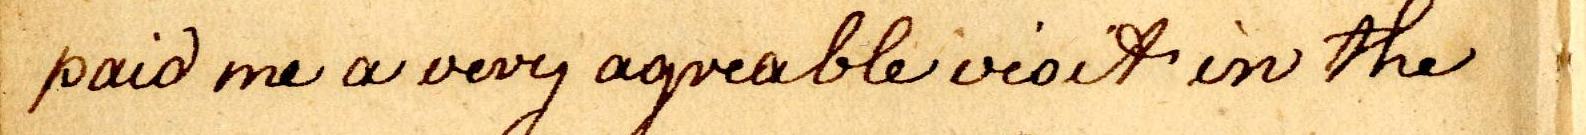paid me a very agreable visit in the
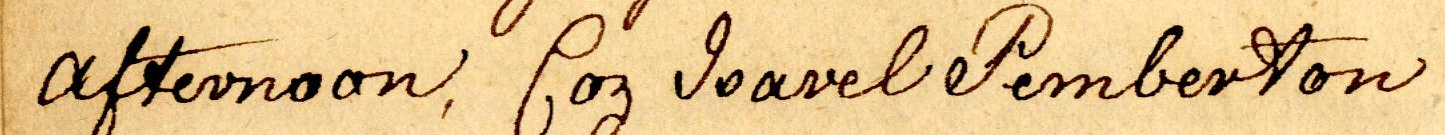Afternoon, Coz Isarel Pemberton
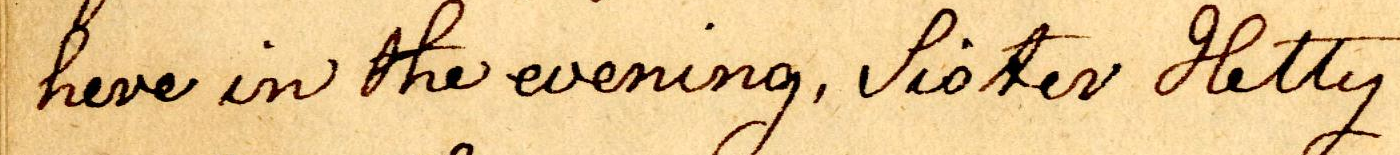have in the evening, Sister Hetty
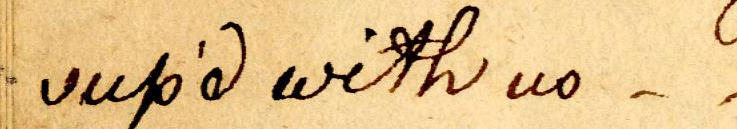sup'd with us-
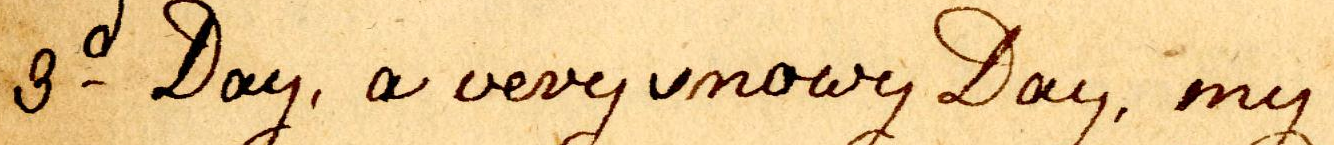3^d Day, a very snowy Day, my
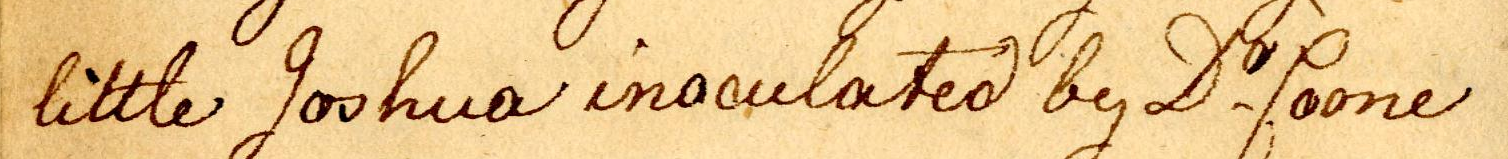little Joshua inoculated by D^r Coone
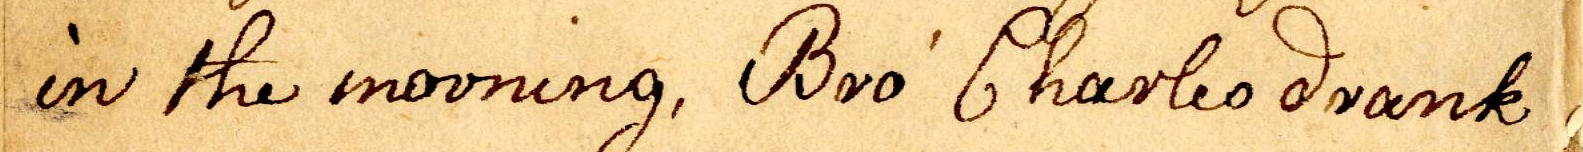in the morning, Bro' Charles drank
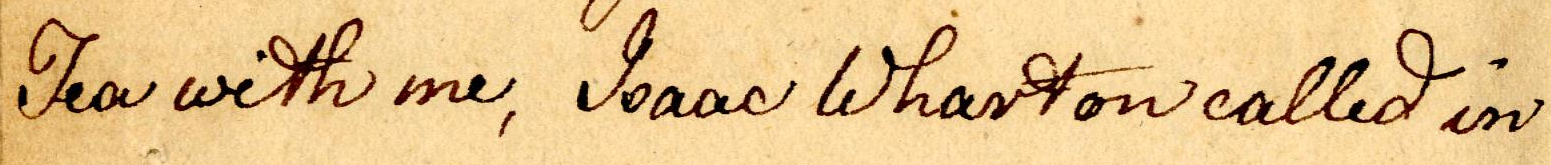Tea with me, Isaac Wharton called in
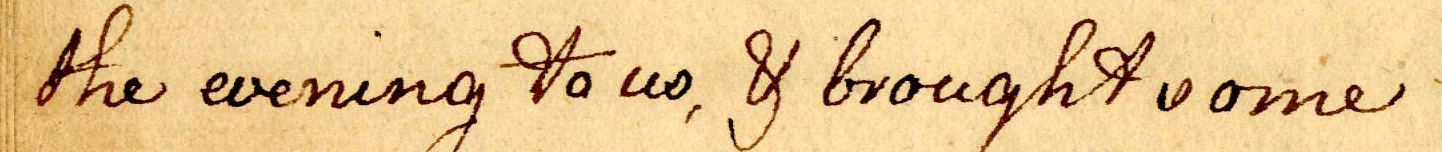the evening to us, & brought some
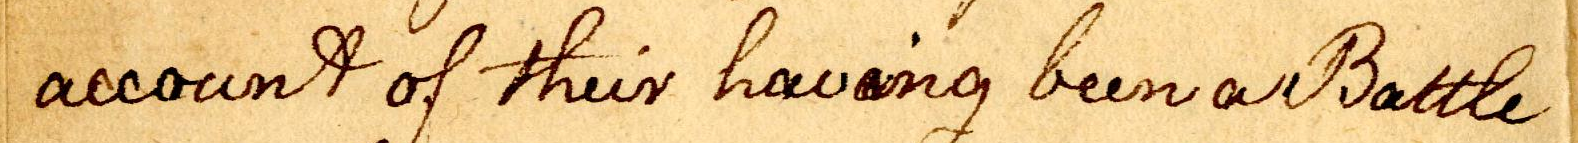account of their having been a Battle
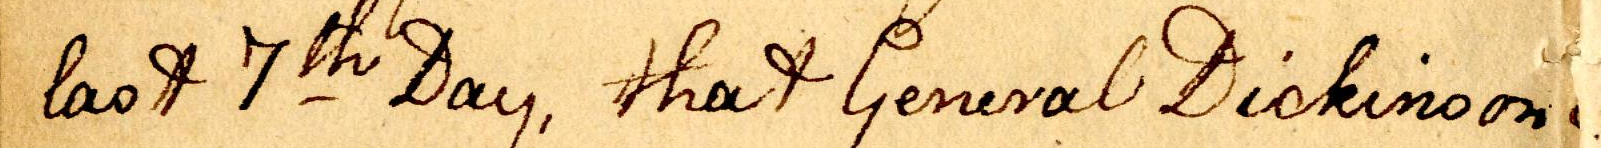last 7^th Day, that General Dickinson
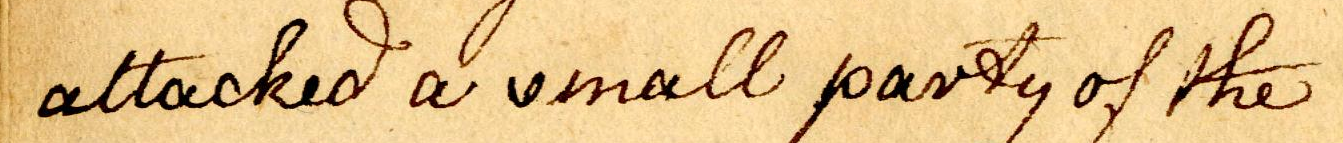attacked a small party of the
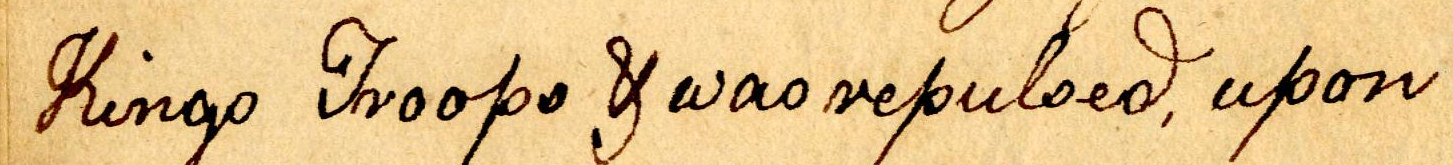Kings Troops & was repulsed, upon
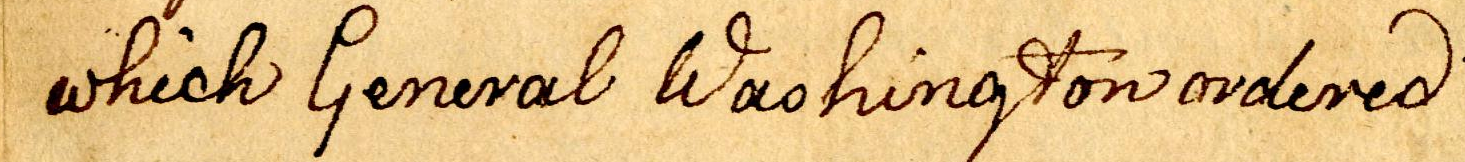which General Washington ordered
